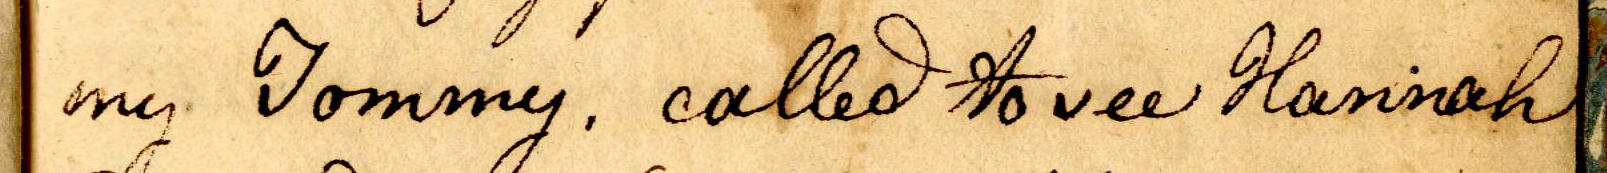my Tommy, called to see Hannah
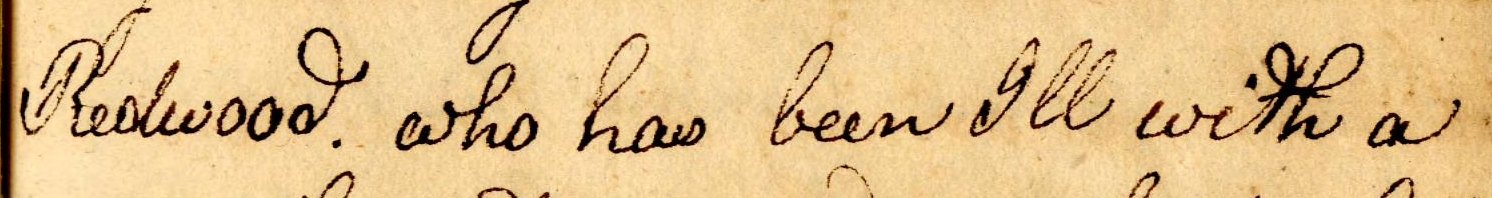Redwood. who has been Ill with a
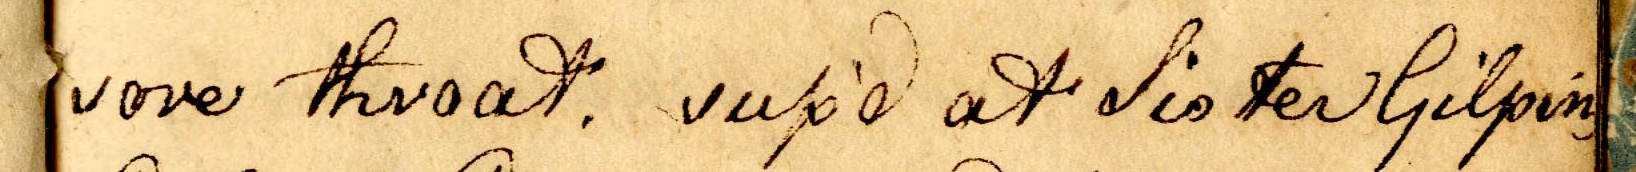sore throat. sup'd at Sister Gilpins
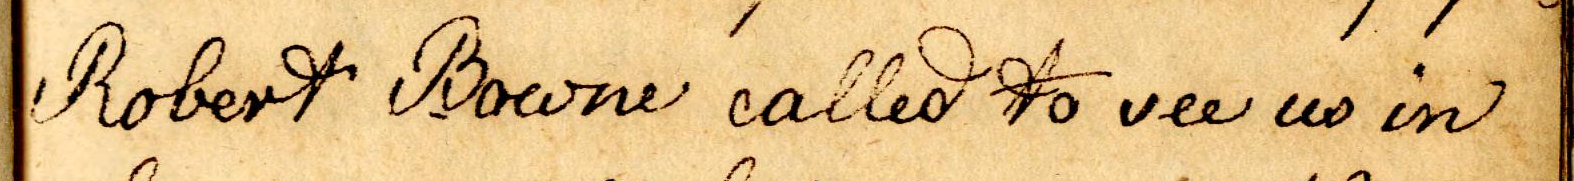Robert Bowne called to see us in
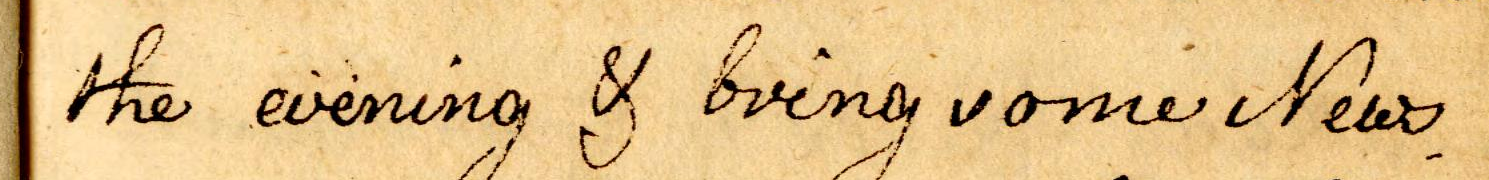the evening & bring some News,
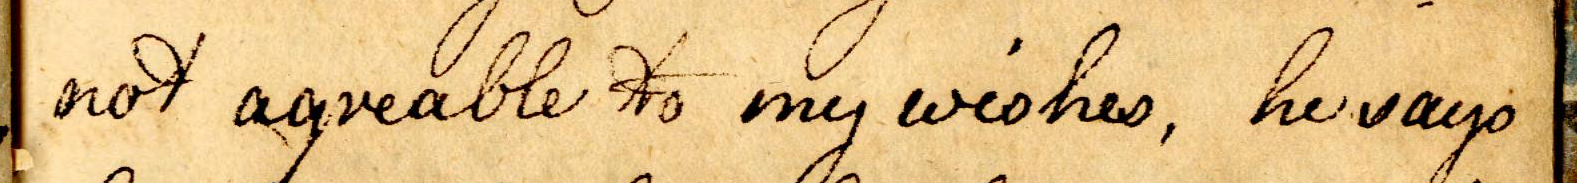not agreable to my wishes, he says
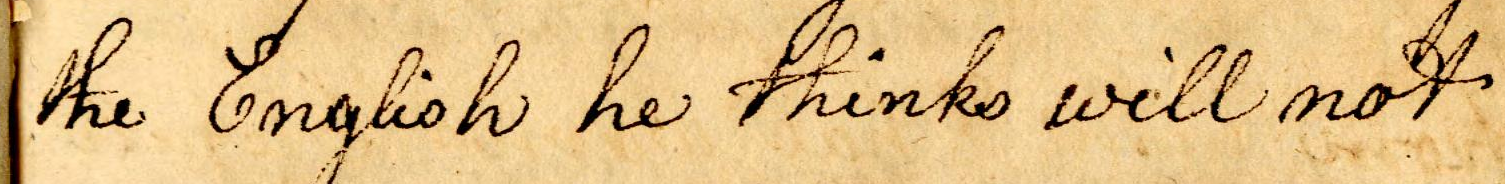the English he thinks will not
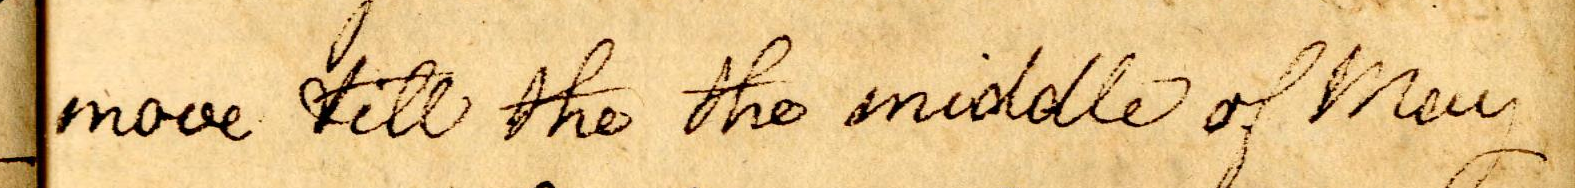move till the the middle of May
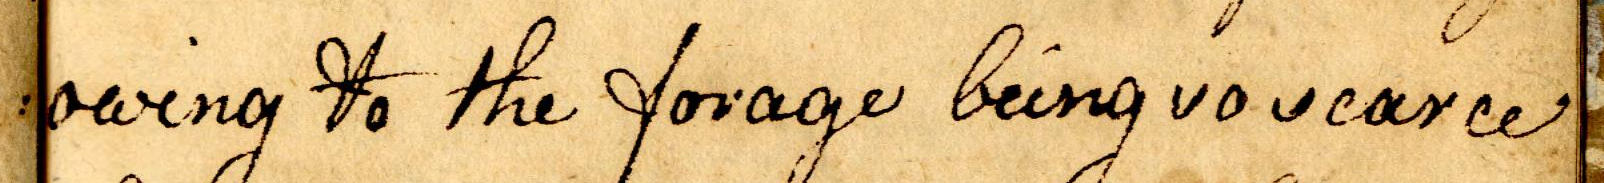owing to the forage being so scarce
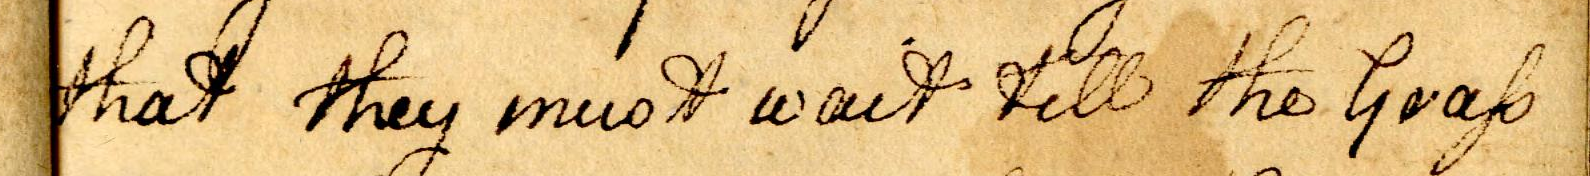that they must wait till the Grass
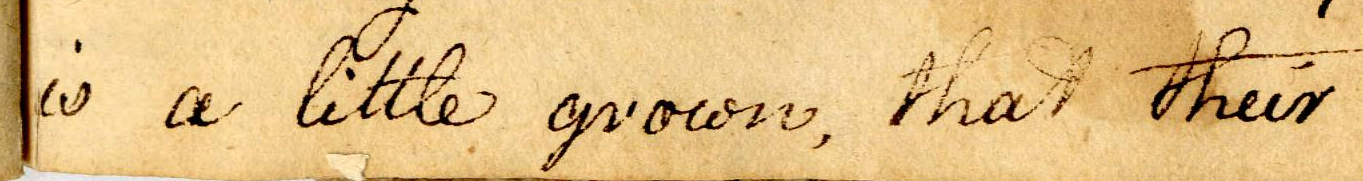is a little grown, that their
